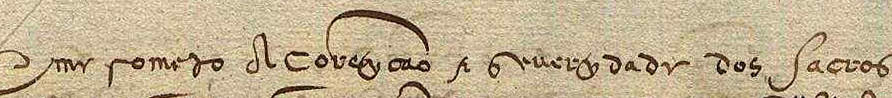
e me someto A coreyção e seuerydade dos Sacros
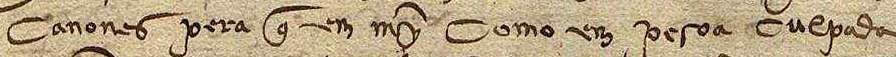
Canones pera q̄ em mȳ Como em pesoa culpada
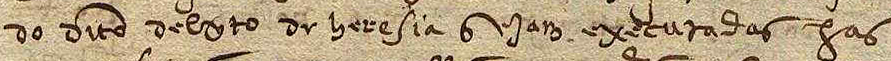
do dīto delyto de heresia sejam executadas has
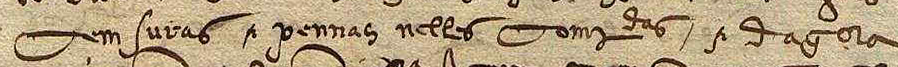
Cemsuras e pennas nelles Comtdas / e dagora
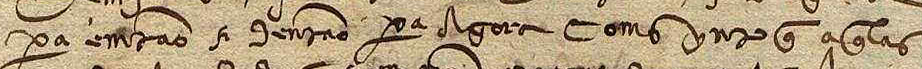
ꝑa emtão e dentão ꝑa Agora comsynto q̄ aq̄las
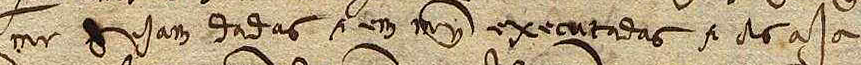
me seJam dadas e em mȳ executadas e As aJa
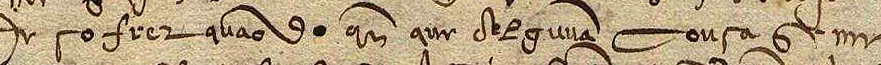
de sofrer quãodo q̄r que Alguūa Cousa se me
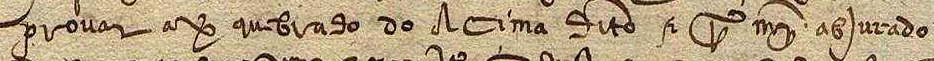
prouar aꝟ quebrado do Acima dīto e p̄o mȳ abJurado
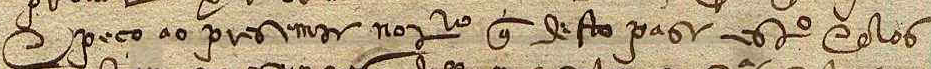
e peço ao presemte notro q̄ desto pase esto e Aos
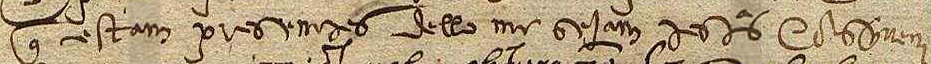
q̄ estam presemtes dello me seJam testas e Asynem
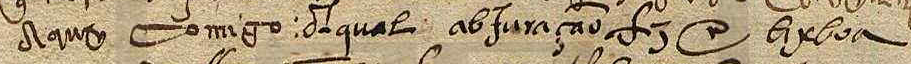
Aquy Comigo: A qual abJuração fez ē lixboa
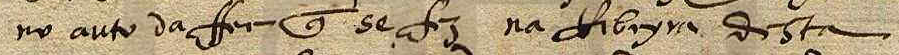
no auto da ffee q̄ se fez na Ribeyra desta
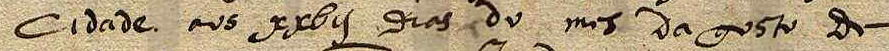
Cidade aos xxbij dias do mes dagosto de
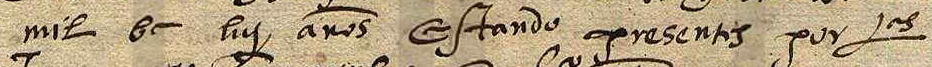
miL bc liij an̄os Estando presentes por tas
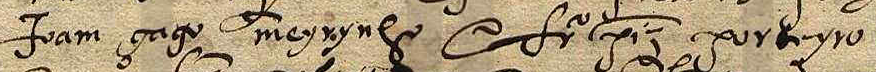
Joam gago meyrynho e frco p̄iz porteyro
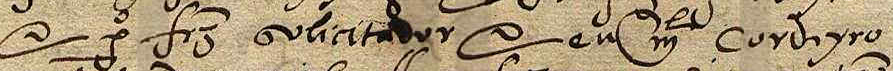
e po frz̄ solicitador e eu meL Cordeyro
